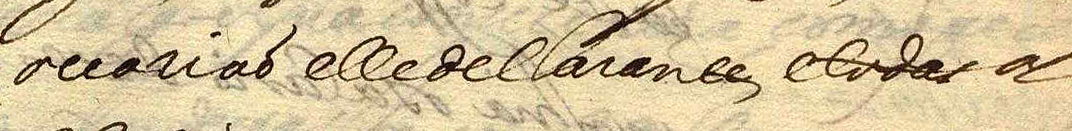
occaziaõ elle declarante, e todas as
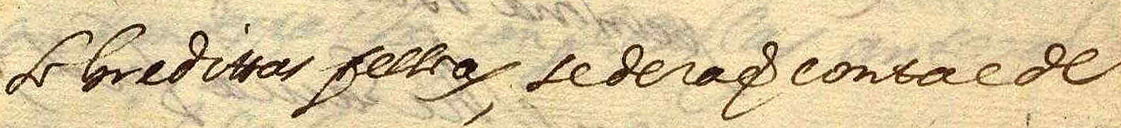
sobredittas pessoas, se deraõ conta e de
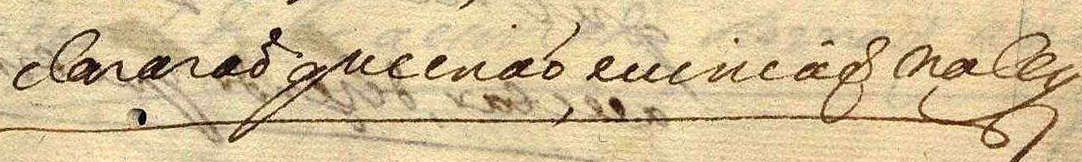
clararaõ que criaõ e uiuiaõ na ley
